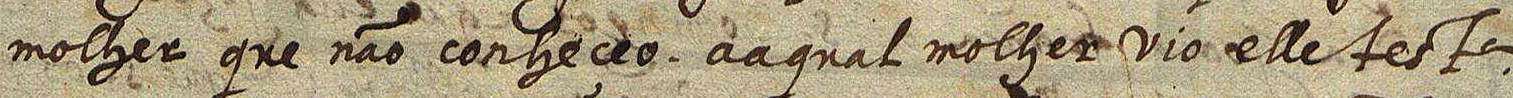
molher que não conheçeo aa qual molher vio elle testa.
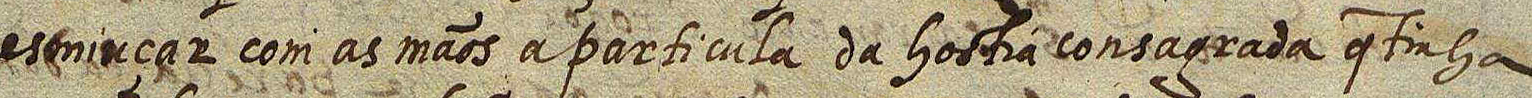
esmiuçar com as maõs a particula da hostia consagrada q̄ tinha
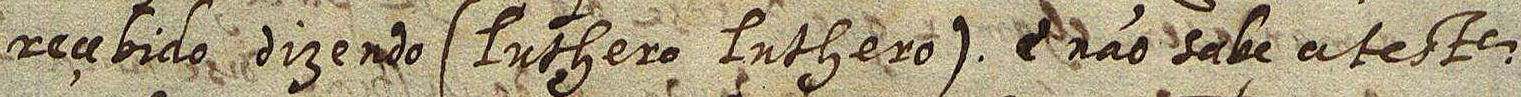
reçebido dizendo (Luthero Luthero). e naõ sabe a testa.
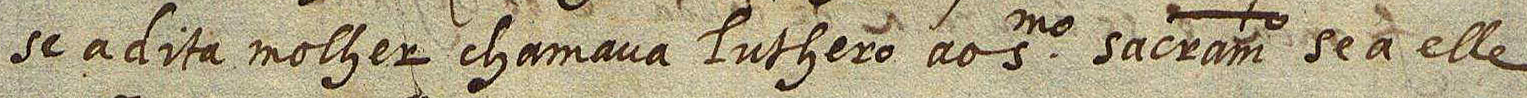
se a dita molher chamaua Luthero ao smo. sacramto se a elle
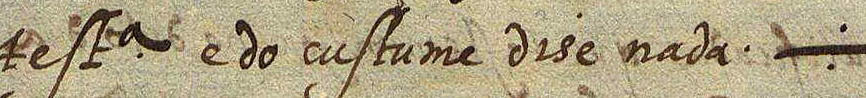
testa. e do custume dise nada.
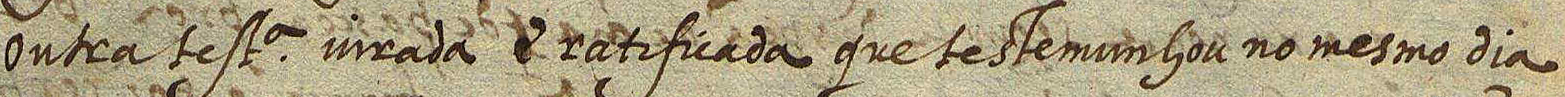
outra testa. iurada e ratificada que testemunhou no mesmo dia
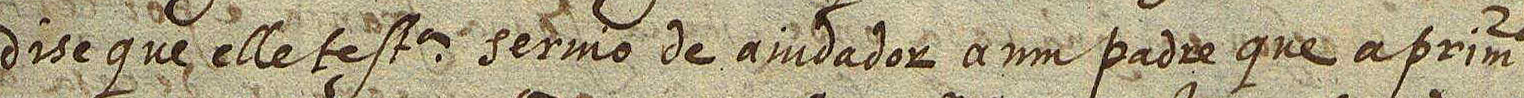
dise que elle testa. seruio de aiudador a um padre que a primra
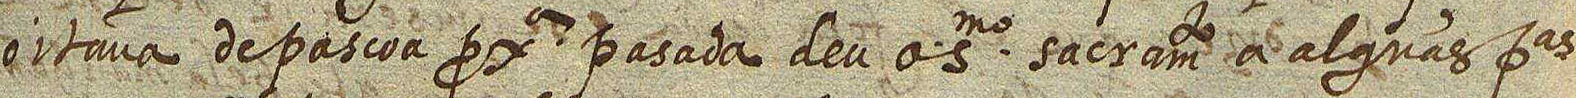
oitaua de pascoa ꝓxa. pasada deu o .smo. sacramto a alguās pas
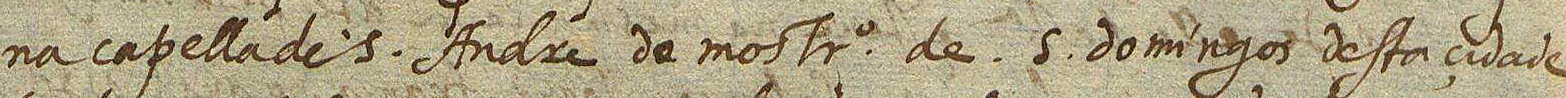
na capella de .s. Andre do mostro. de s. domingos desta çidade
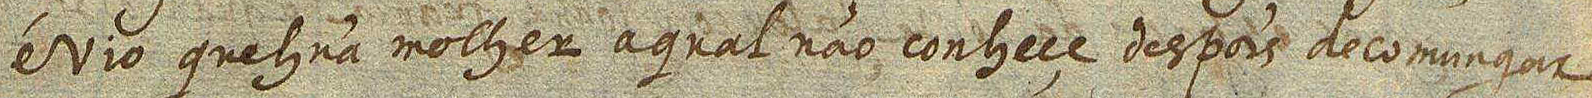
e vio que huā molher a qual não conheçe despois de comungar
